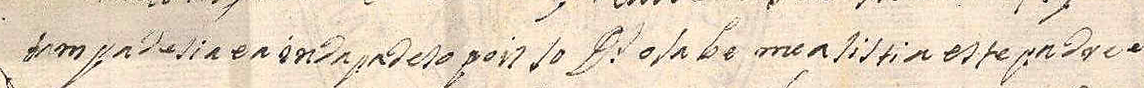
tam padesia e ainda padeso pois so D.s o sabe me asistia este padre e
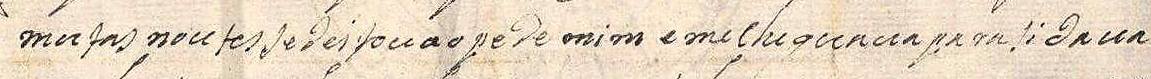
mutas noutes se deitou ao pe de mim e me cheguaua para si daua
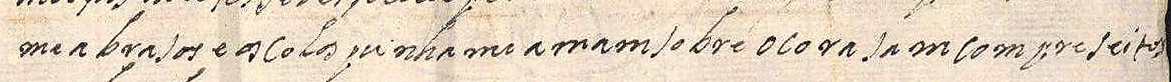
me abrasos, e oscolos punhame a mam sobre o corasam com preseitos
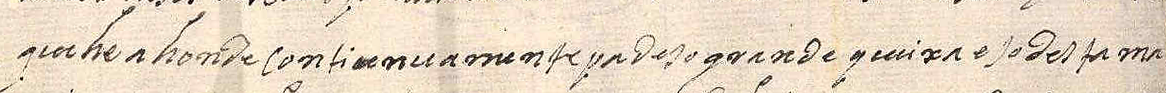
que he ahonde contiunuamente padeso grande queixa e so desta ma
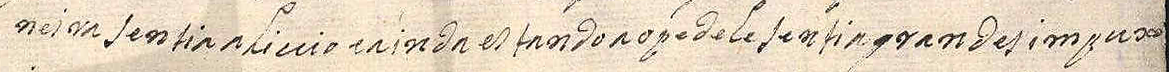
neira sentia aliuio e ainda estando ao pe dele sentia grandes impuxo
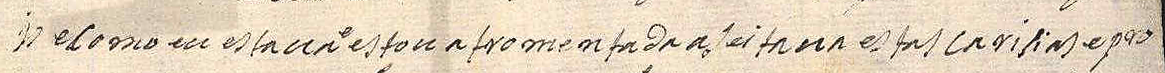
is e como eu estaua e estou atromentada aseitaua estas carisias e pro
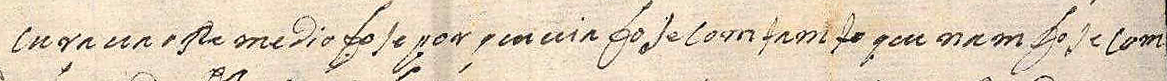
curaua o Remedio fose por que uia fose comtamto que nam fose com
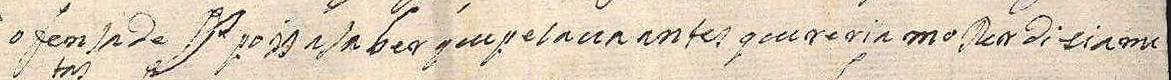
ofensa de Ds pois a saber que pecaua antes quereria moRer diziame
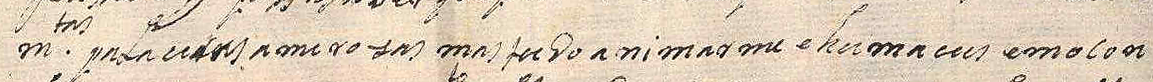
m.tas palauras amerosas mas tudo animarme e huma ues em o con
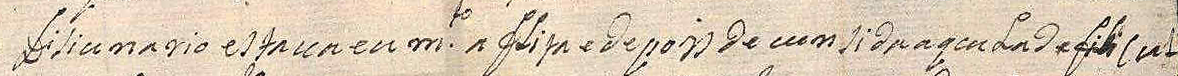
fisiunario estaua eu m.to aflita e depois de uensida aquela defiliCul
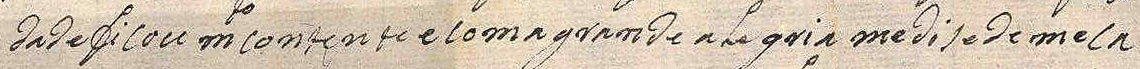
dade ficou mto contente e com a grande alegria me dise deme ca
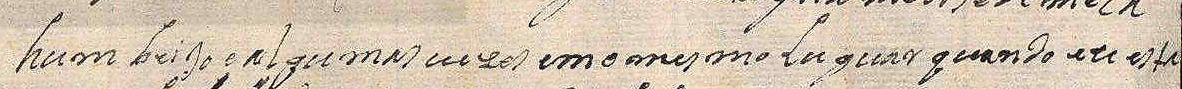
hum beijo e algumas uezes em o mesmo luguar quando cre esta
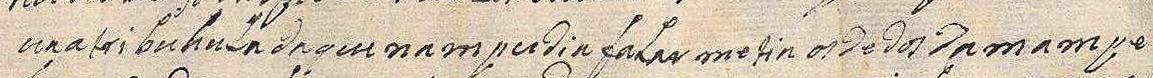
ua atribuhulada que nam pudia falar metia os dedos da mam pe
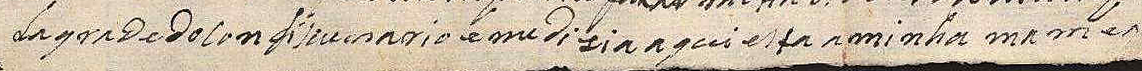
da grade do comfissiunario e me dizia aqui esta a minha mam es
